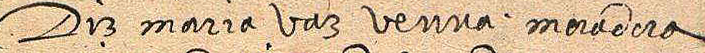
Diz maria vaz veuua moradora
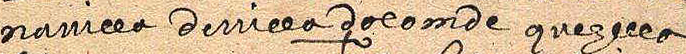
na uilla de uilla do comde que hella
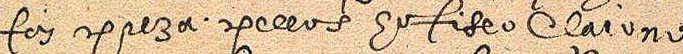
foy preza pello sto hofiseo e çaio no
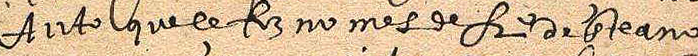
Auto que çe fez no mes de fro deste ano
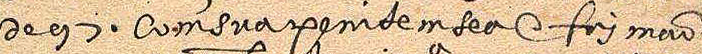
de 97. com sua penitemsea e foy maõ
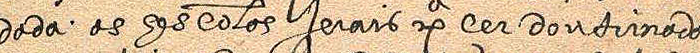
dada as hescolas Jerais pa çer doutrinada
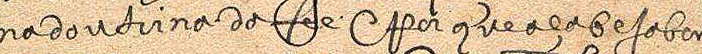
na doutrina da fee e porque a çabe Ja bē
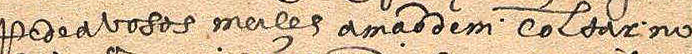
pede a vosas merçes a maõdem coltar no
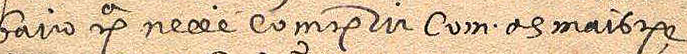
bairo pa nelle comprir com as mais pe
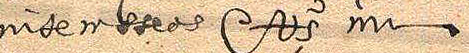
nitemsseas e Rꝭo mr
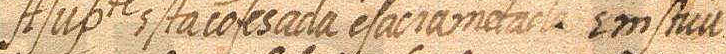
A supte esta cōfesada e sacramētada E instrui
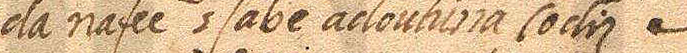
da na fee E sabe a doutrina co diz e
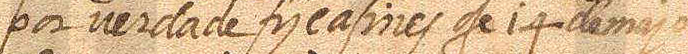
por uerdade fiz e asinej oJe i4 de majo
